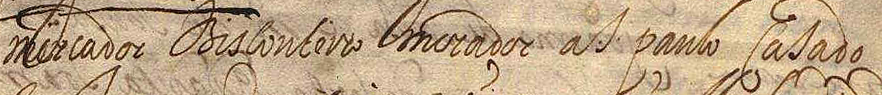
mercador Biscouteiro morador a S. paulo Casado
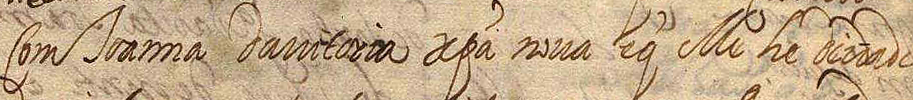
Com Ioanna da uitoria xpā noua e q̄ elle he de idade
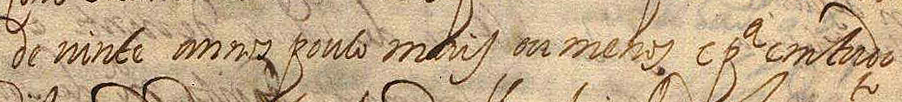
de uinte annos pouco mais ou menos, e pa em tudo
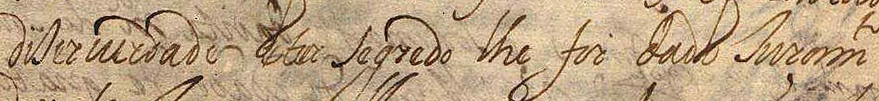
diser uerdade e ter segredo lhe foi dado Iuramto
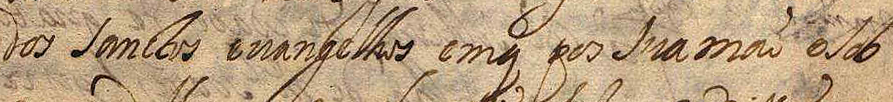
dos Sanctos euangelhos em q̄ pos sua maõ e sob
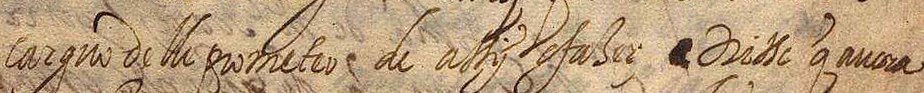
carguo delle prometeo de assȳ o fazer, e Disse q̄ auera
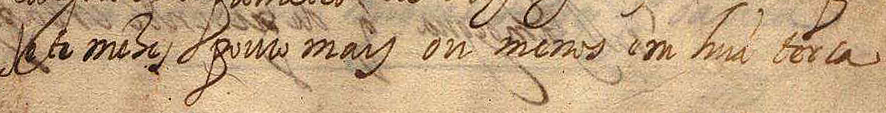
sete mezes pouco mais ou menos em huā terca
